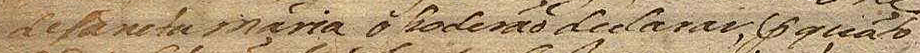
de sancta maria o poderaõ declarar, p̄ quāto
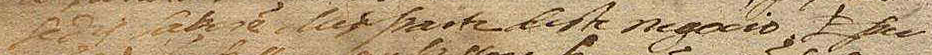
se dis saberē elles parte deste negocio. E per
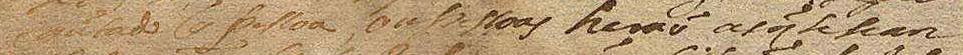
gūtado q̄ pessoa, ou pessoas heraõ as q̄ se scan
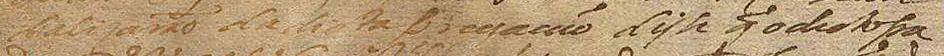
dalizaraõ da dita pregaçaõ disse q̄ o dicto pa
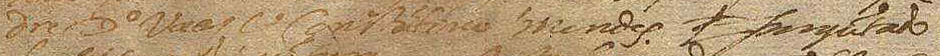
dre Do Vaaz & Contātino mendes. E pergūtado
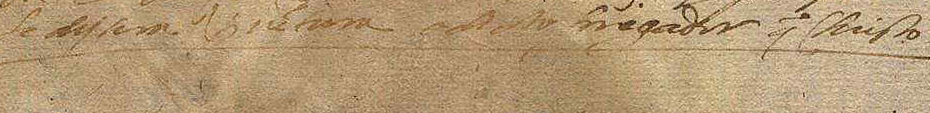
se dissera p̄uētura o dito pregador q̄ Christo
